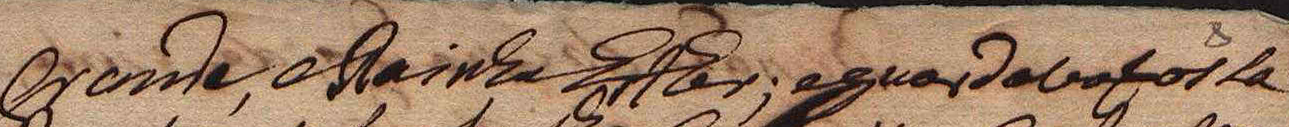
grande, e Rainha Esther; e guardavaõ os sa
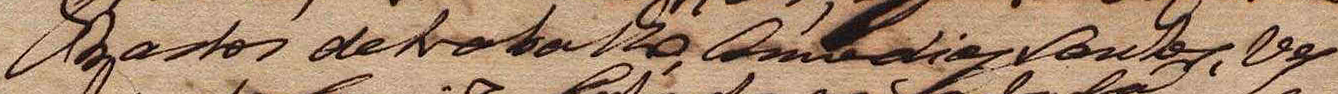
bados de trabalho, como dias santos, ves
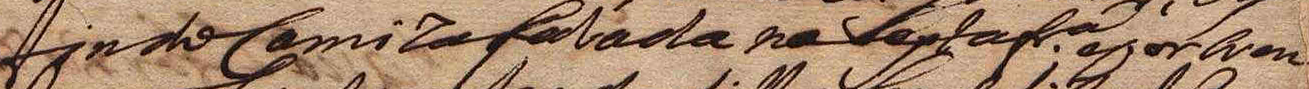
tindo Camiza lavada na sesta fr.a e por cren
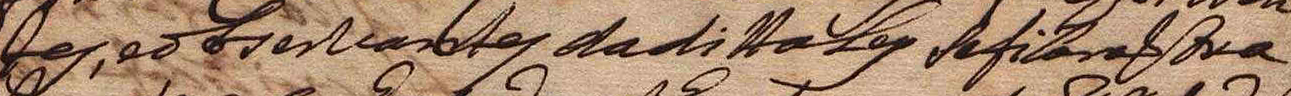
tes, e observantes da ditta Ley se fiCaraõ tra
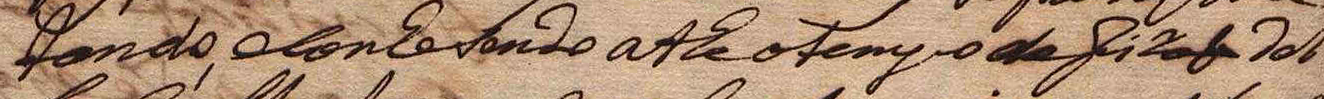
tando, e conhesendo athe o tempo da prizaõ del
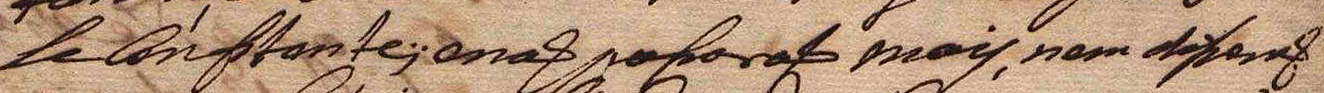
le confitente; e naõ passaraõ mais, nem disseraõ
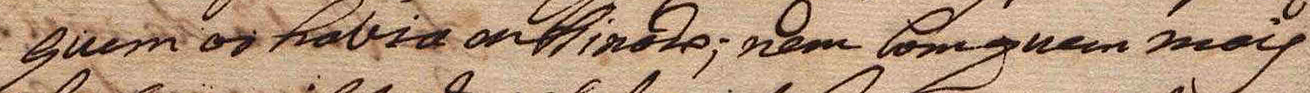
quem os havia ensinado; nem com quem mais
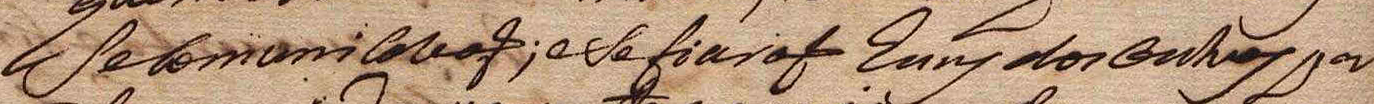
se comunicauaõ; e se fiaraõ huns dos outros por
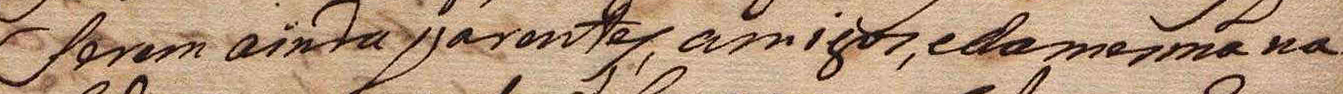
serem ainda parentes, amigos, e da mesma na
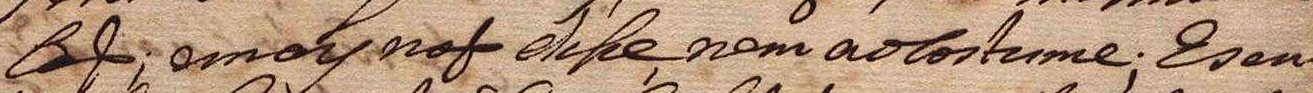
Çaõ; e mais naõ disse nem ao costume; E sen
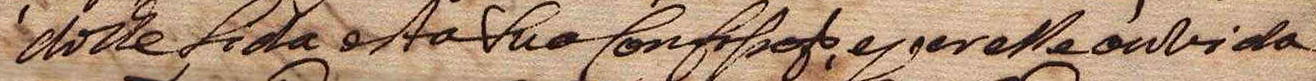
dolhe Lida esta sua Confissaõ, e por elle ouvida
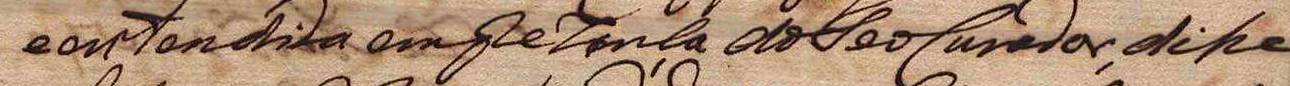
e entendida em pRezença do Seo Curador, disse
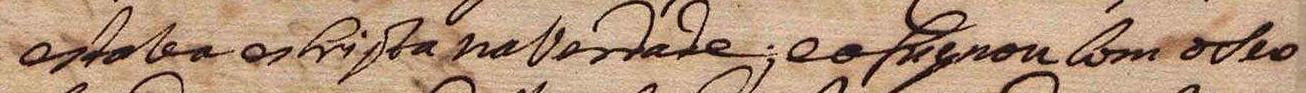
estava esCripta na verdade; e assignou Com o seo
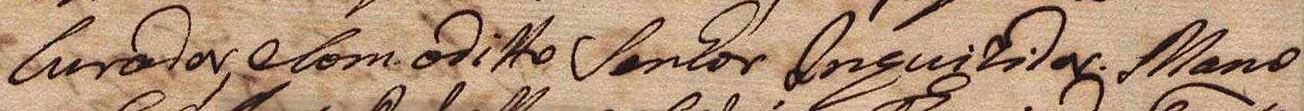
Curador, e com o ditto Senhor Inquizidor. Mano
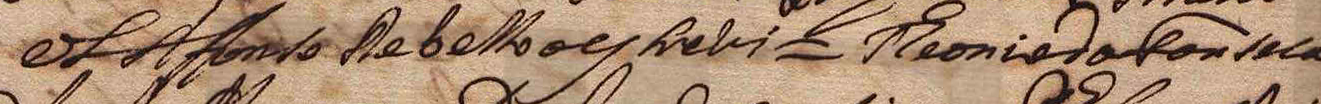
el Affonso Rebello o escrevi = Theonio da Fonseca
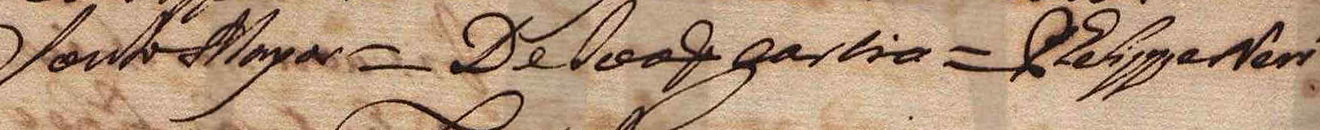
Souto Mayor = De Ioaõ garcia = Phelippe Neri
